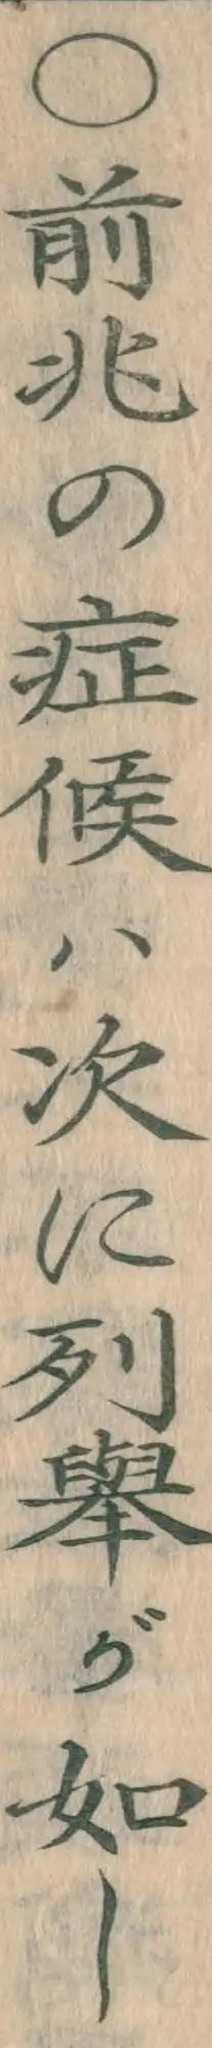〇前兆の症候は次に列挙が如し

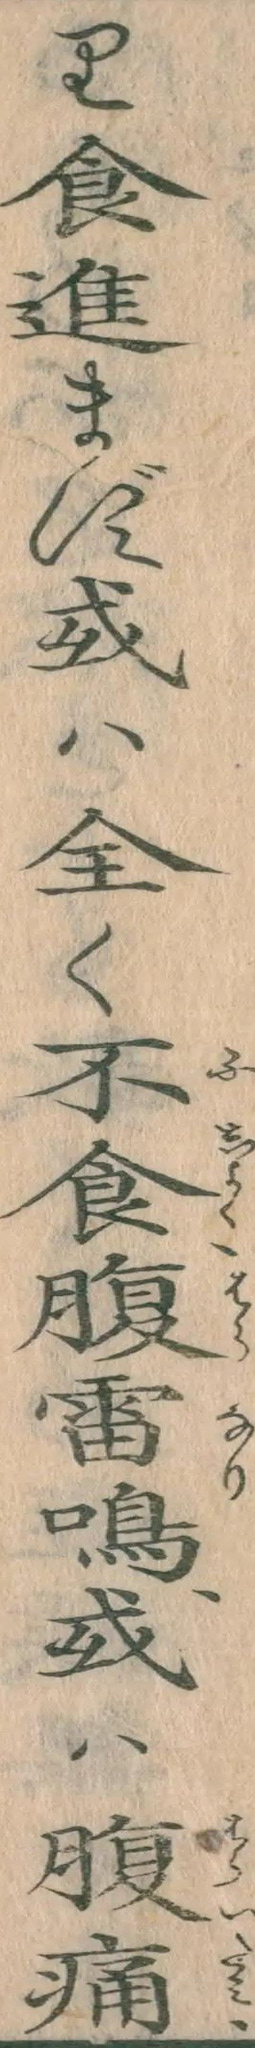り食進まず或は全く不食、腹雷鳴、或は腹痛、
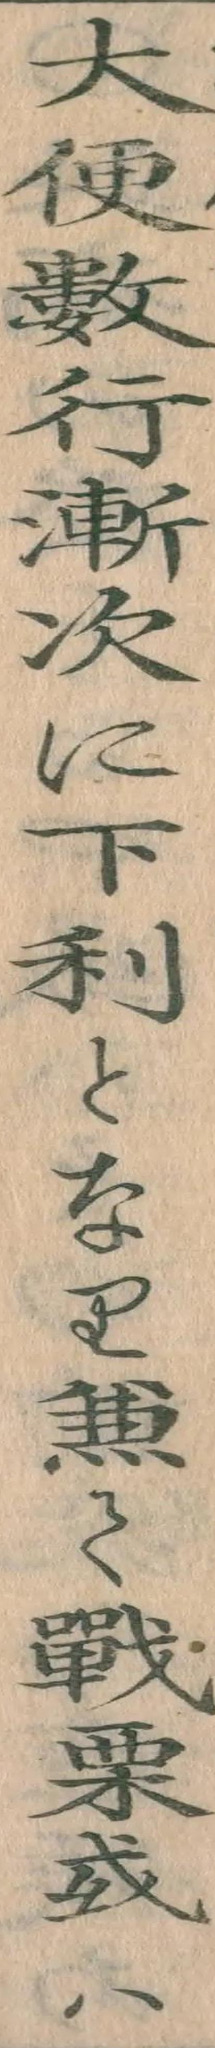大便数行、漸次に下利となり兼て戦栗、或は
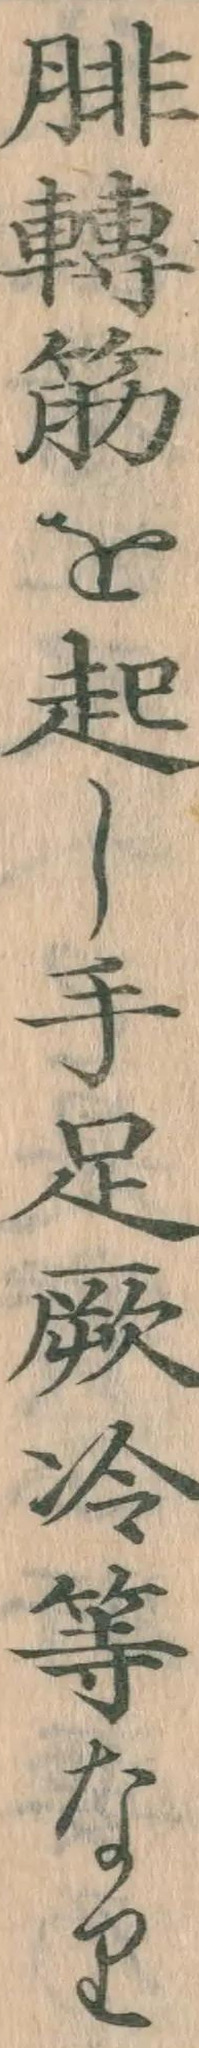腓転筋を起し手足厥冷等なり
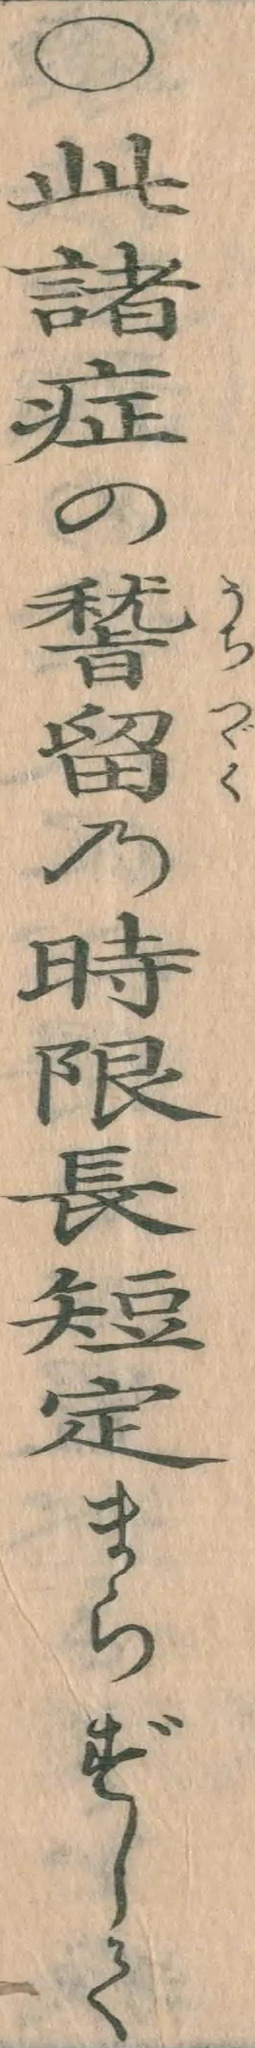〇此諸症の稽留の時限長短定まらずして
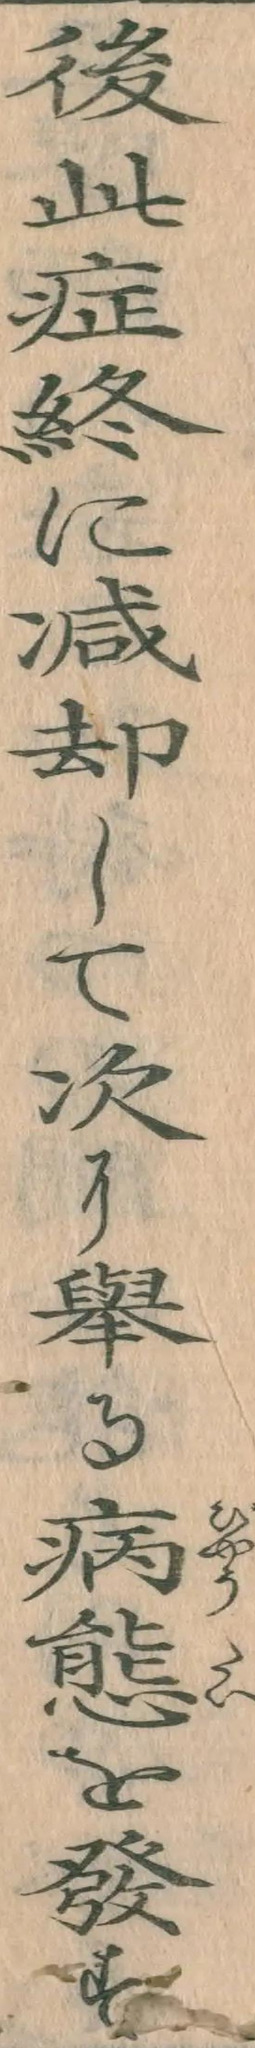後此症終に減却して次に挙る病態を発す
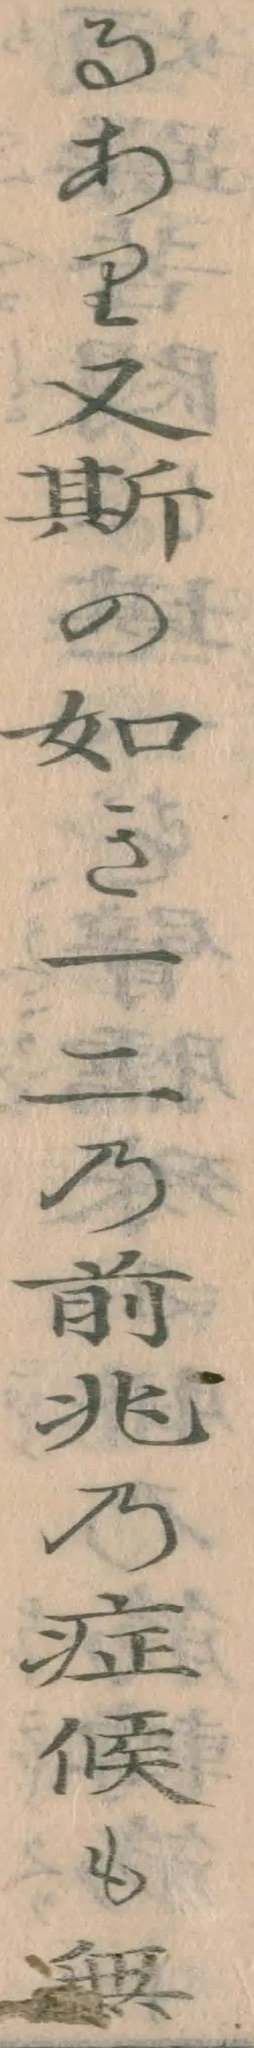るあり又斯の如き一二の前兆の症候も無
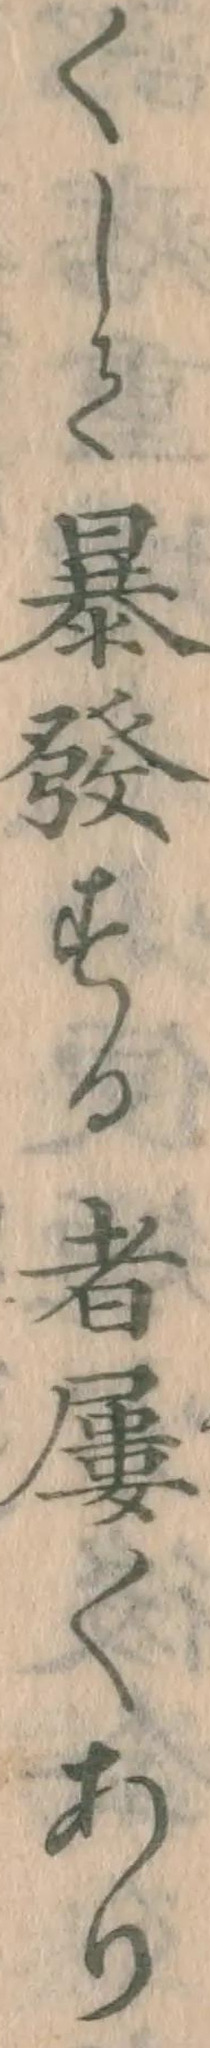くして暴発する者屢〳〵あり
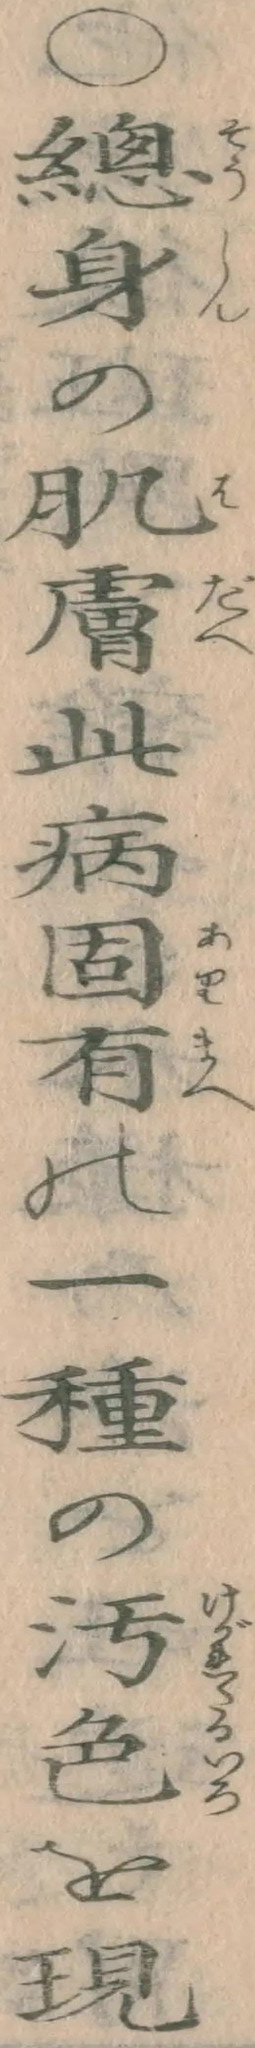〇総身の肌膚此病固有の一種の汚色を現
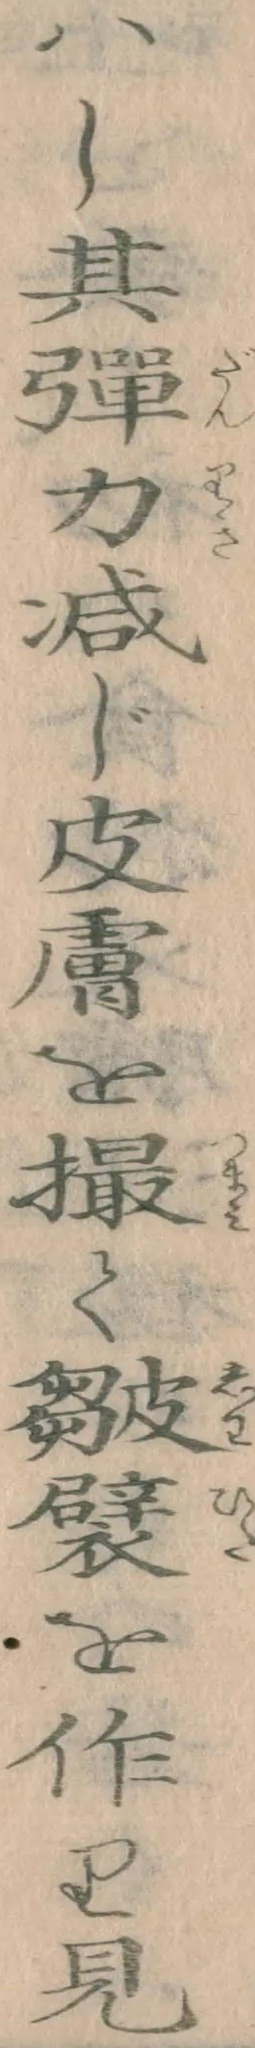はし其弾力減じ皮膚を撮て皺襞を作り見
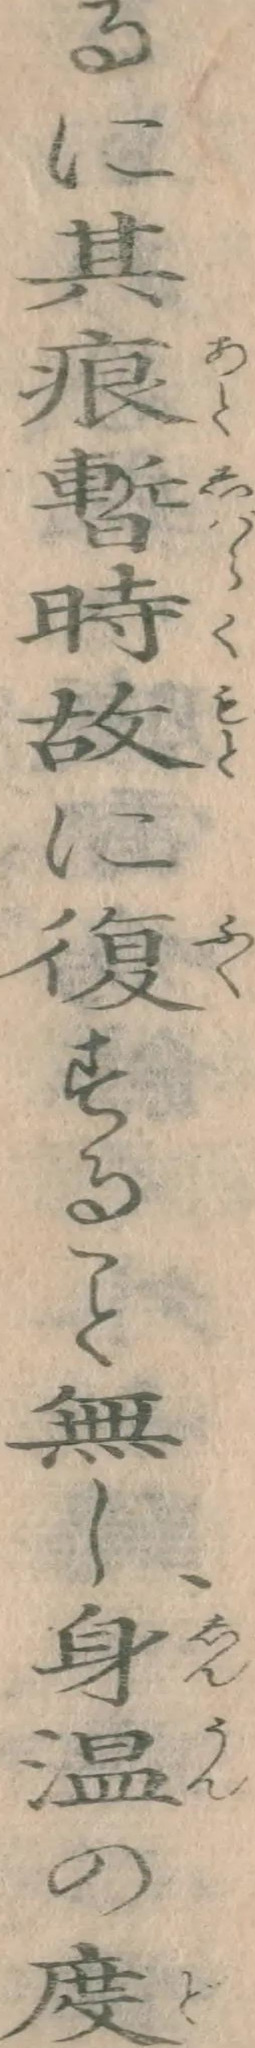るに其痕暫時故に復すること無し、身温の度
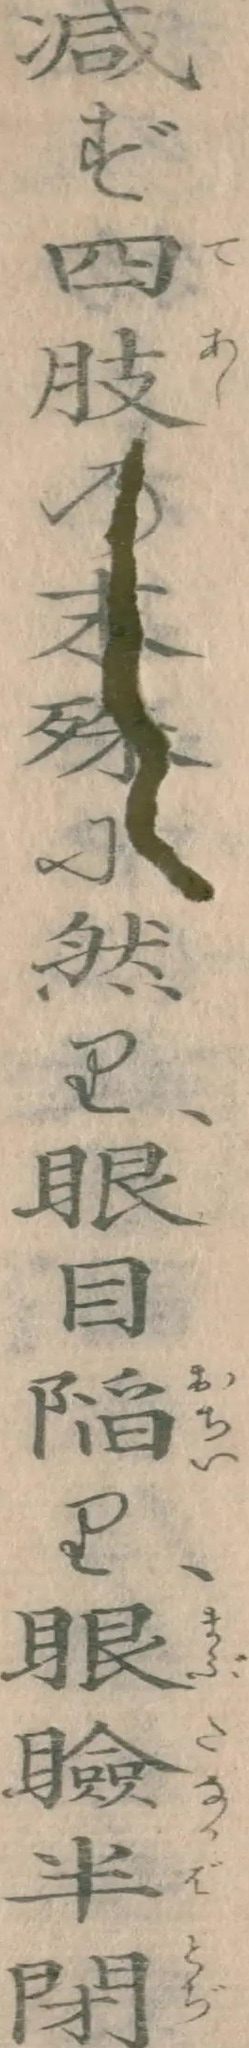減ず四肢の末殊に然り、眼目陥り、眼瞼半閉
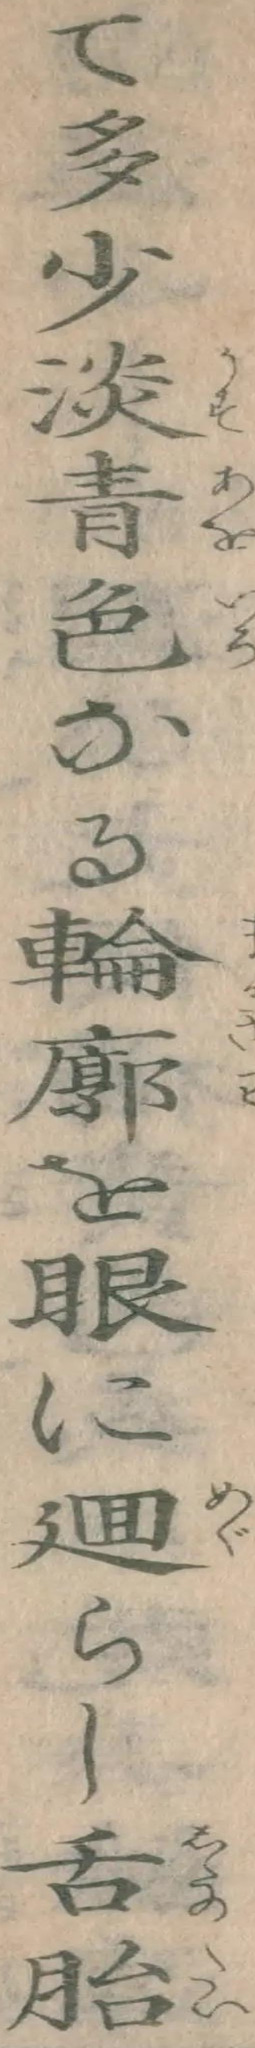て多少淡青色なる輪廓を眼に廻らし舌胎

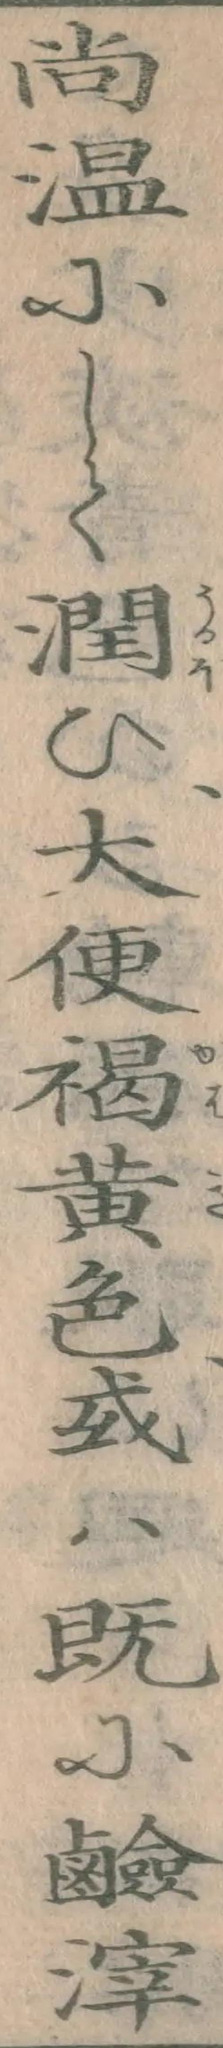尚温にして潤ひ、大便褐黄色、或は既に鹸滓
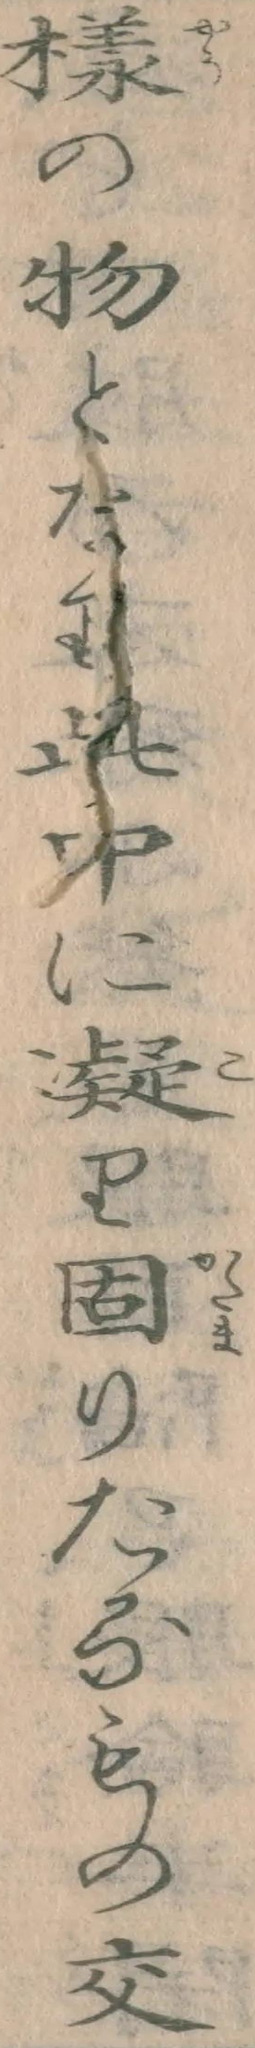様の物となり此中に凝り固りたるもの交
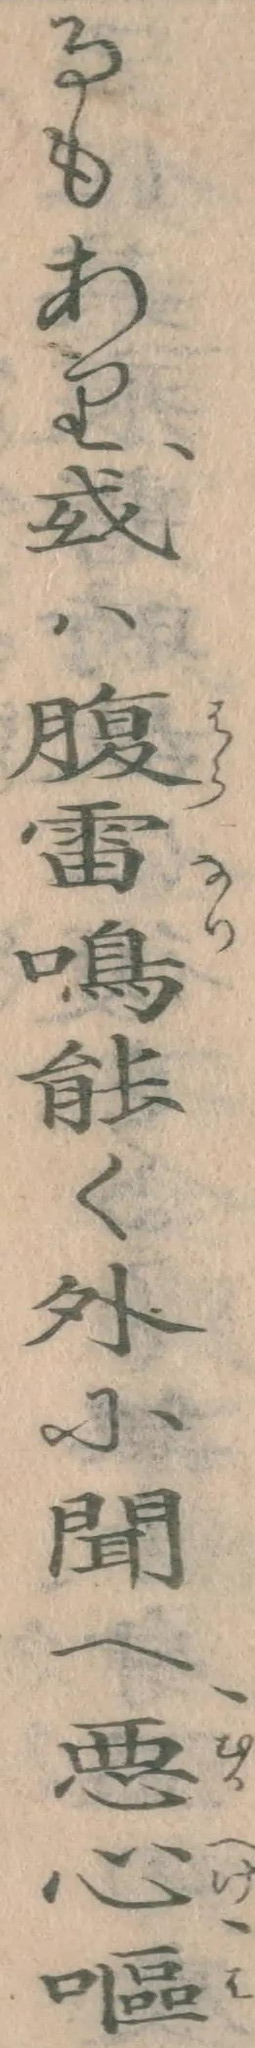るもあり、或は腹雷鳴能く外に聞へ、悪心、嘔
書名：暴瀉病手当素人心得書
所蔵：国立国会図書館 National Diet Library, JAPAN
